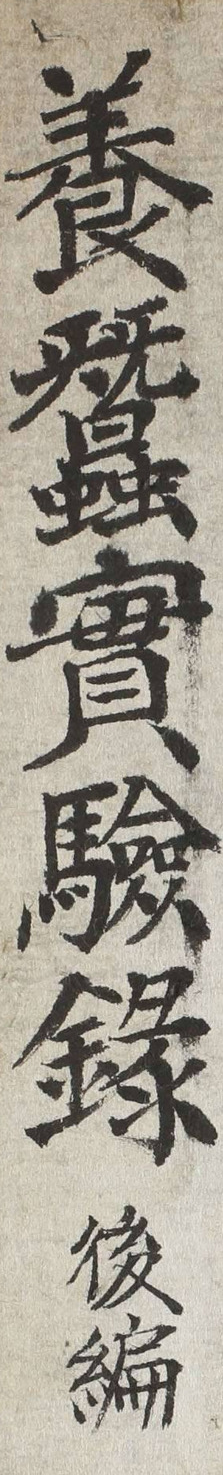養蠺實験録後編

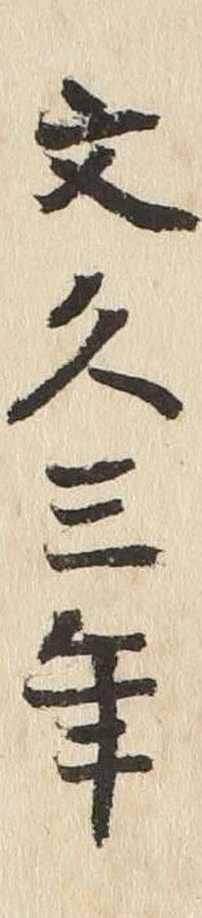文久三年

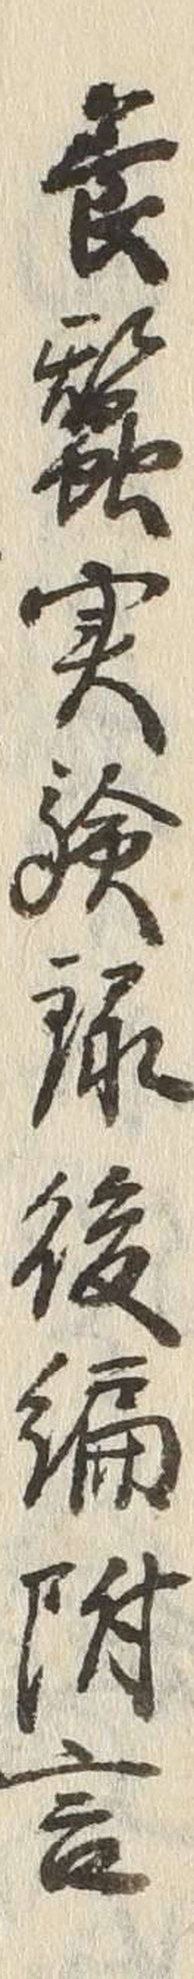養蠺實験録後編附言
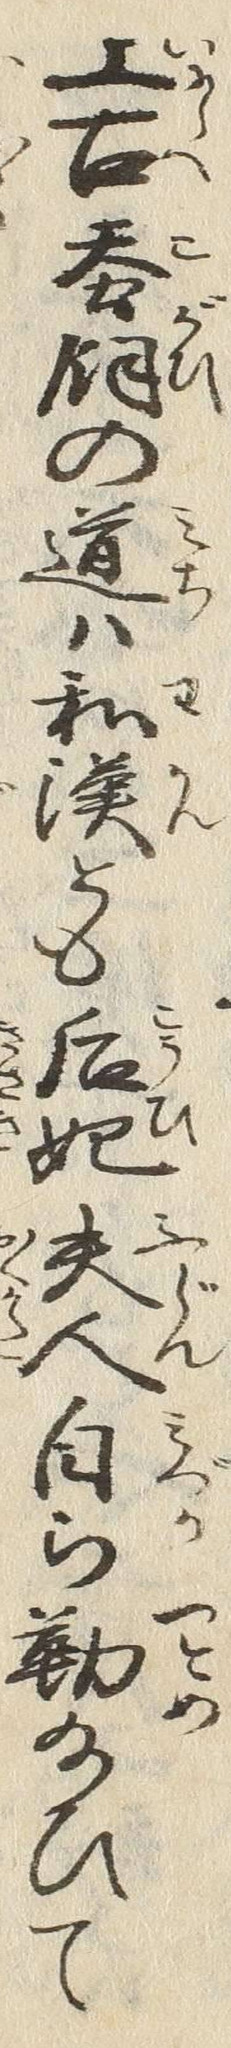上古蚕飼の道は和漢とも后妃夫人自ら勤ゐひて
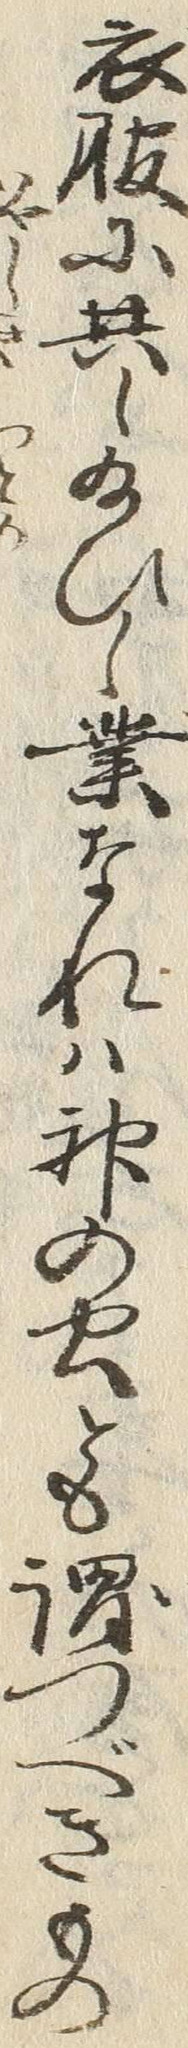衣服尓共しゐひし業なれは神の虫とも謂つべきもの
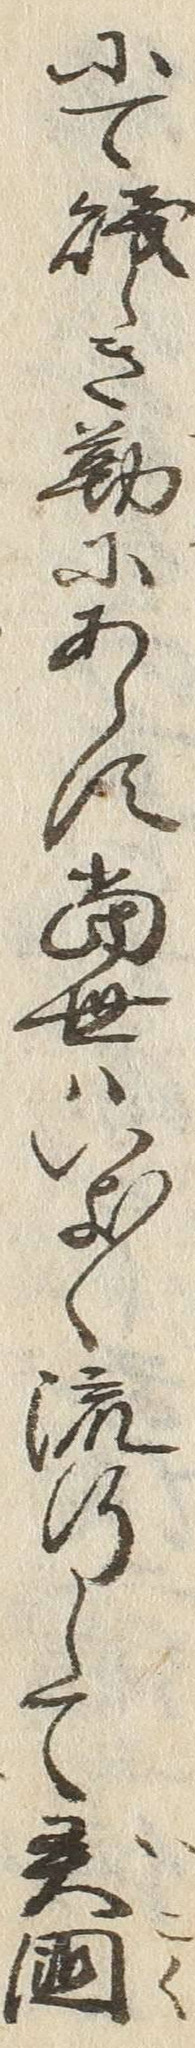尓て賤き勤尓あら須當世はいよ〳〵流行して異國
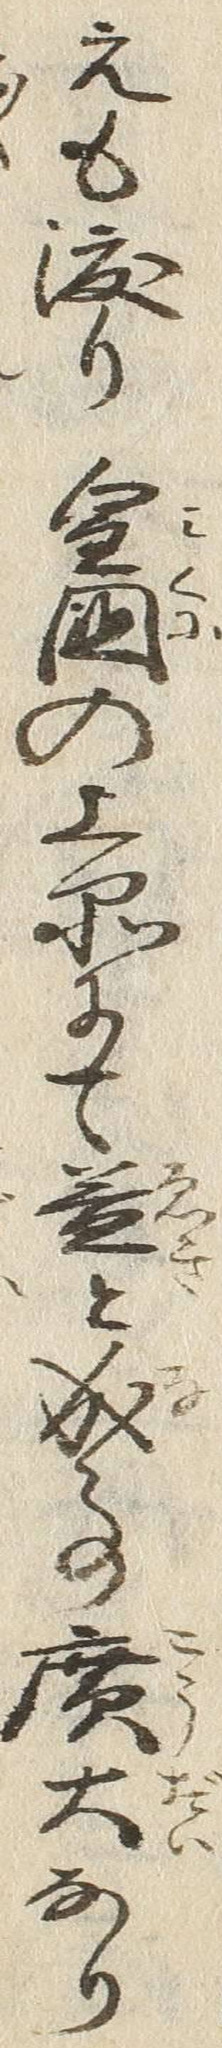えも渡り皇國の上品尓て益と成事廣大なり
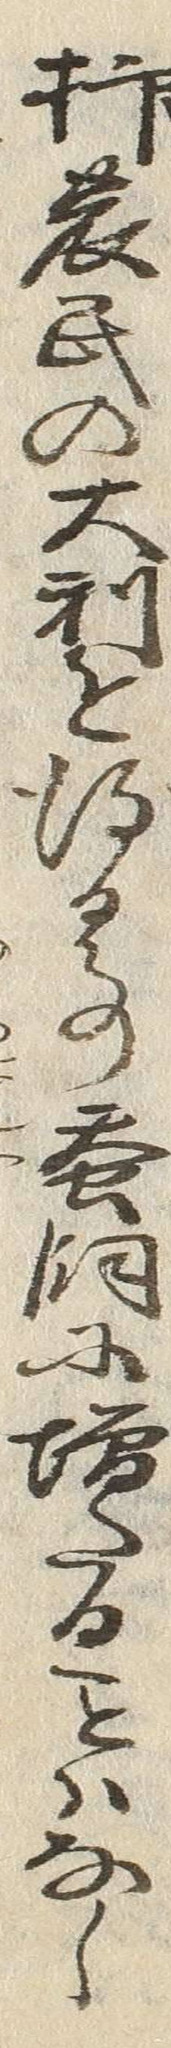抑農民の大利と得る事蚕飼尓増たることはなし
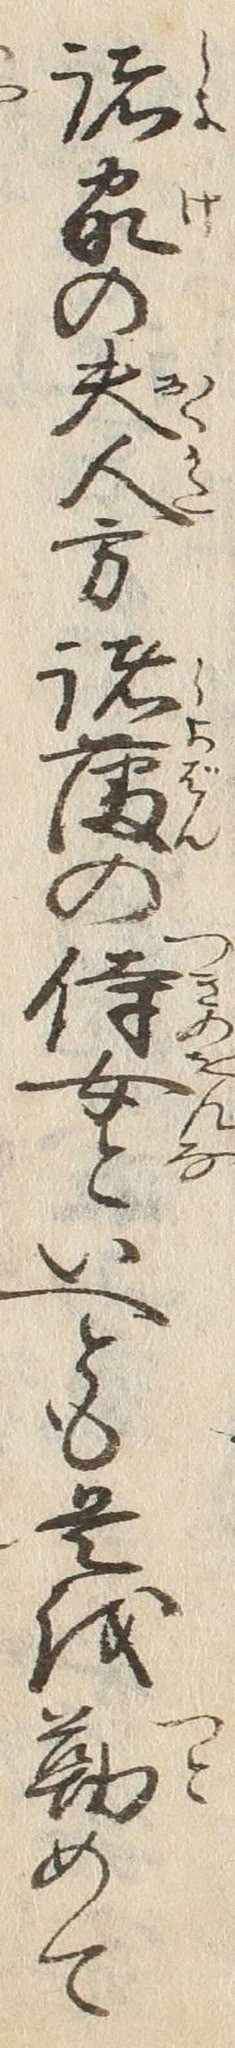諸家の夫人方諸藩の侍女といへとも是越勤めて
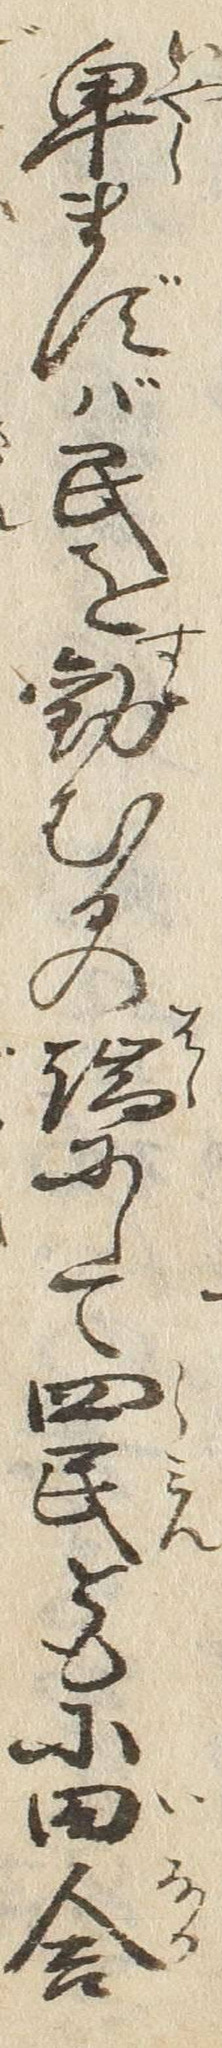卑まずば民を勧むるの端尓して四民とも尓田舎
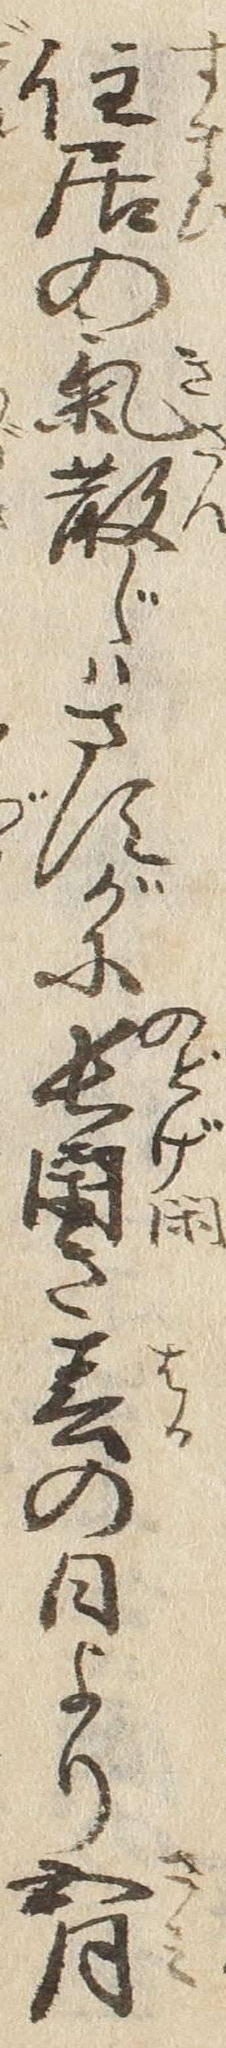住居の氣散じはさ須が尓長閑き春の日より五月
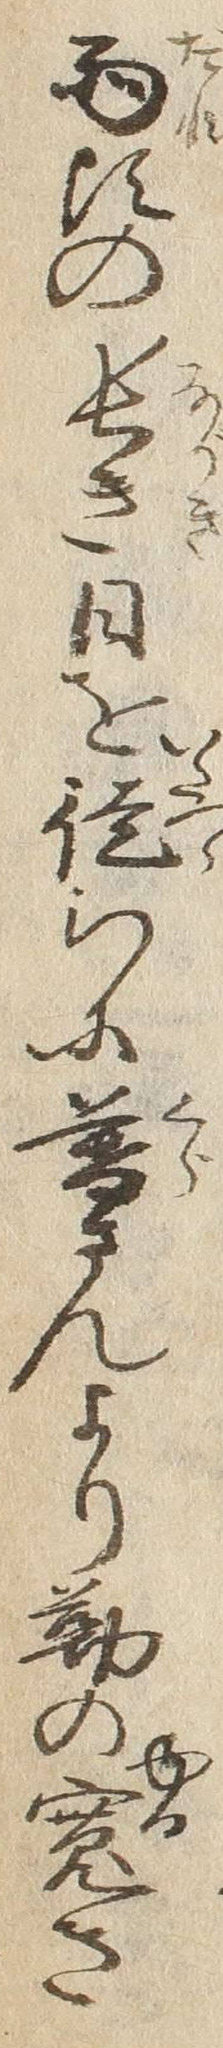雨頃の長き日を徒ら尓暮さんより勤の寛き

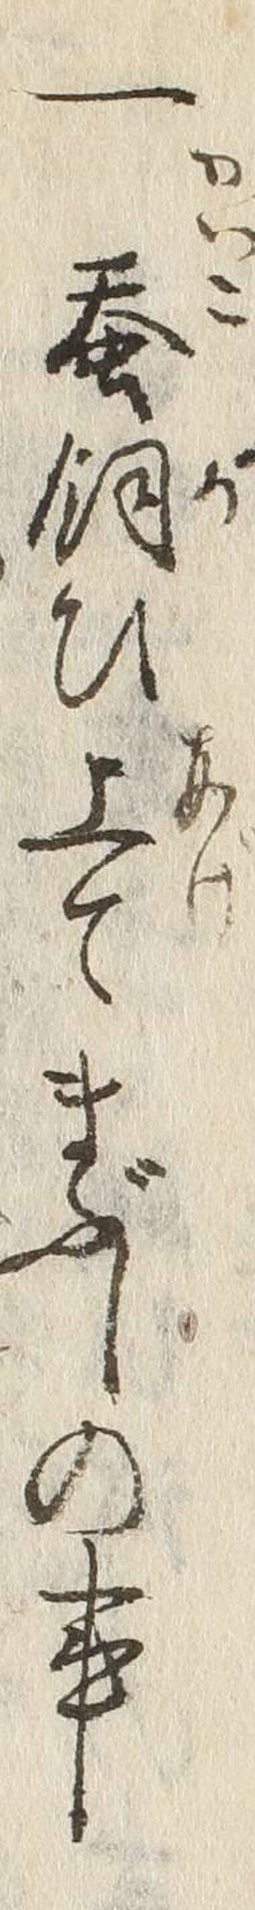一蚕飼ひ上てまぶしの事初丁
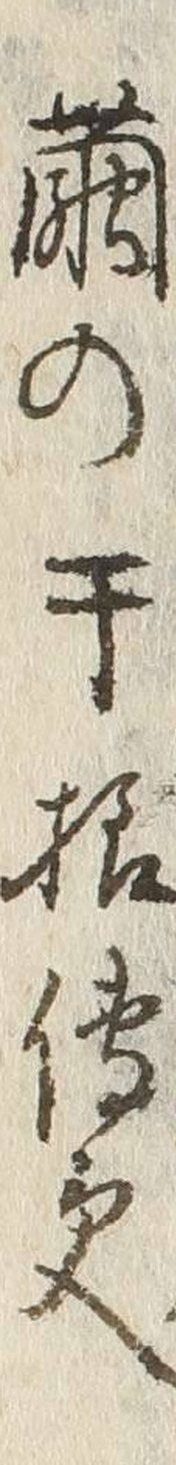繭の干様傳受
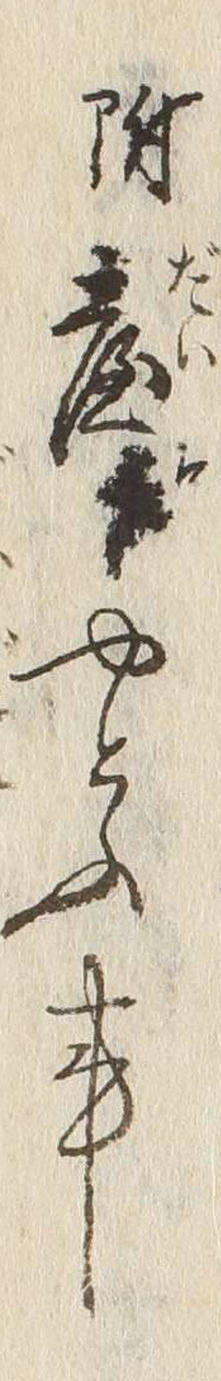附臺江やとふ事
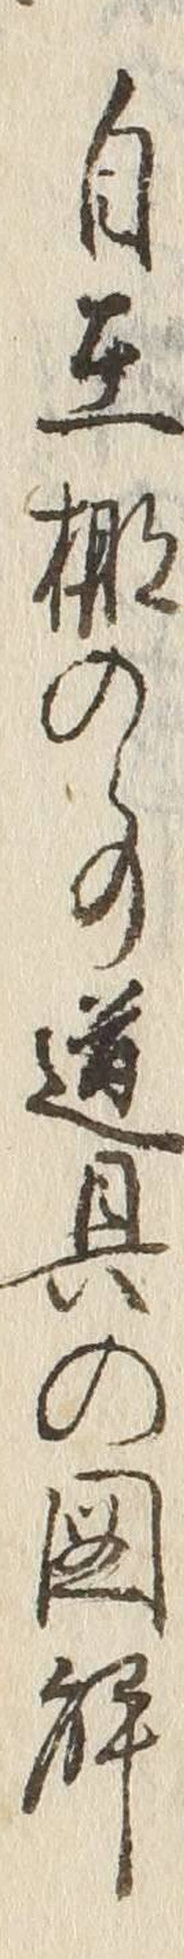自在棚の事道具の図解
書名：養蠶實驗録後編
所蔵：東京大学農学生命科学図書館 国文学研究資料館
